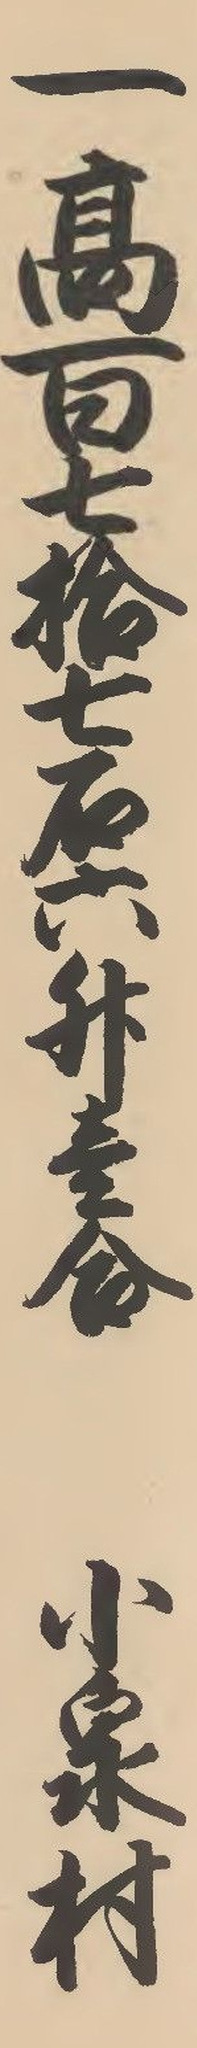一髙百七拾七石六升壱合小泉村
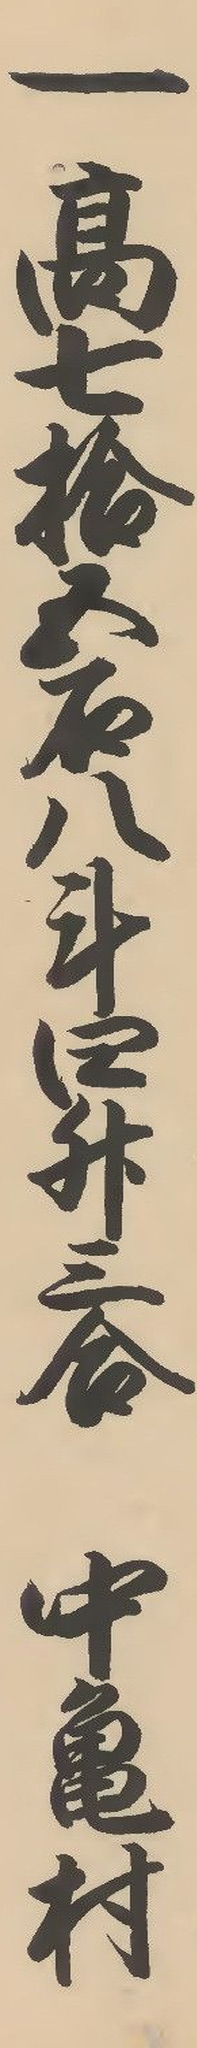一髙七拾五石八斗四升三合中亀村
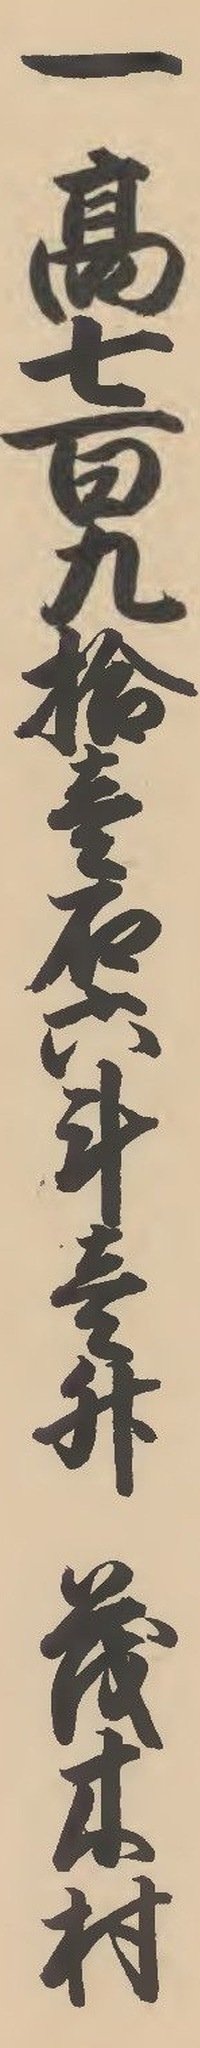一髙七百九拾壱石六斗壱升茂木村
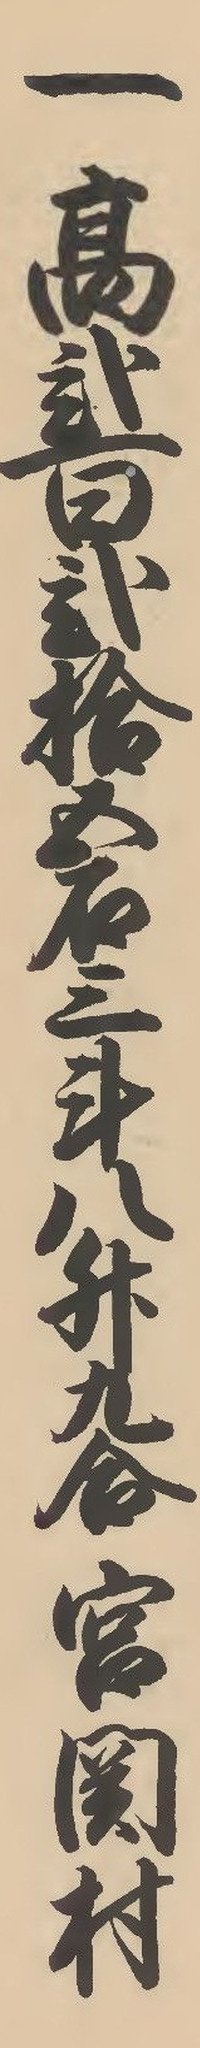一髙弐百弐拾五石三斗八升九合宮関村

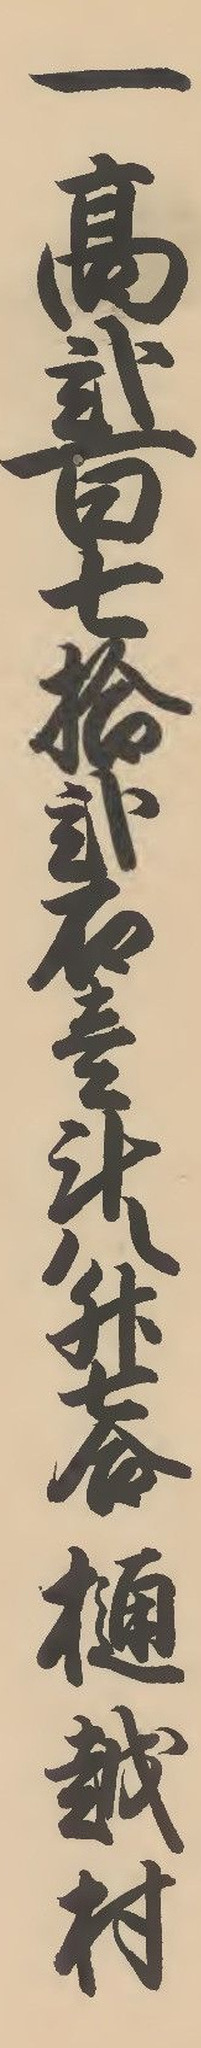一髙弐百七拾弐石壱斗八升七合樋越村
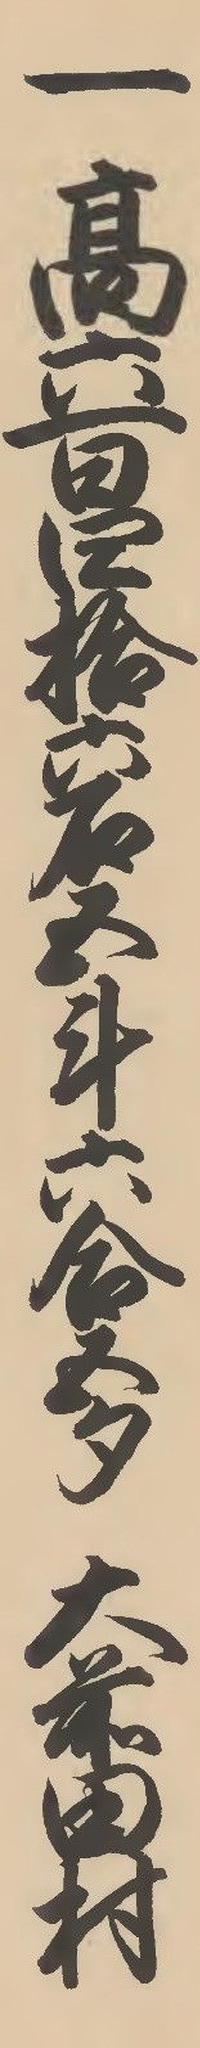一髙六百四拾六石五斗六合五夕大前田村
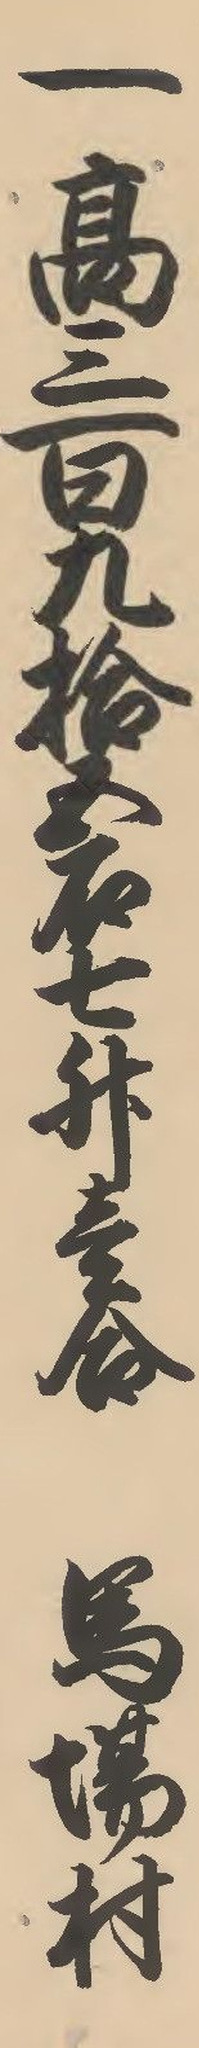一髙三百九拾五石七升壱合馬場村
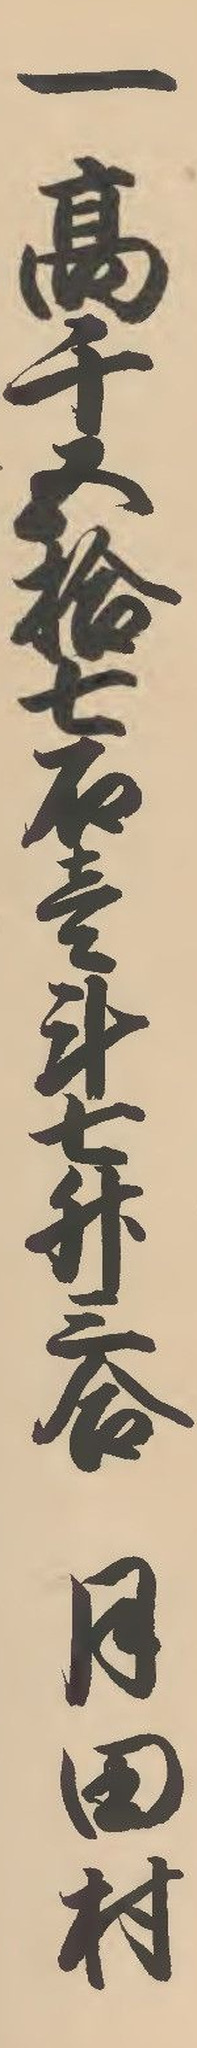一髙千五拾七石壱斗七升三合月田村
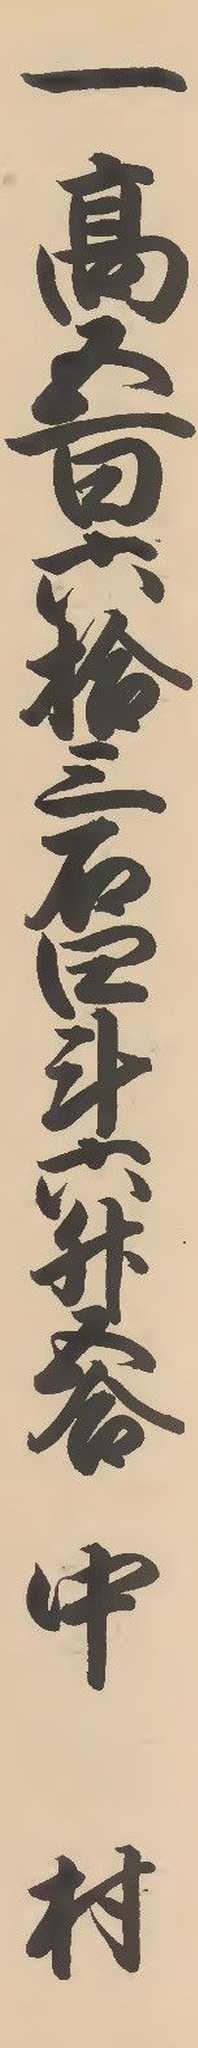一髙五百六拾三石四斗六升五合中村
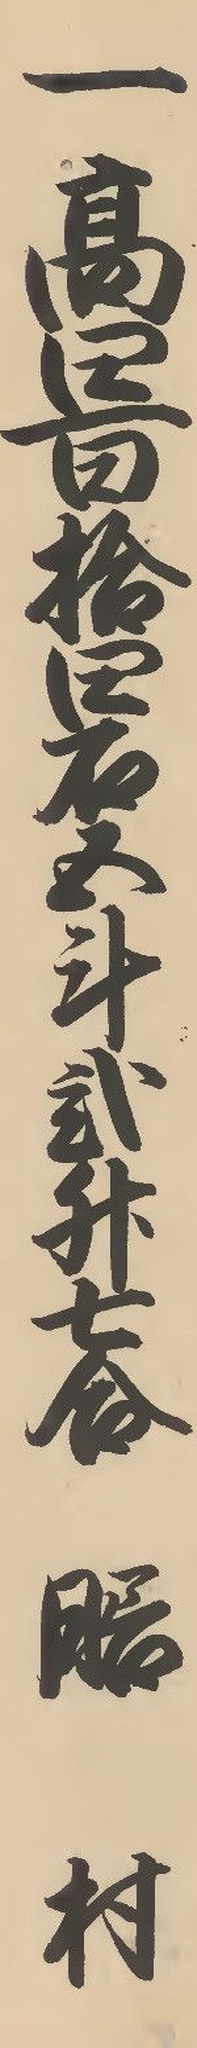一髙四百拾四石五斗弐升七合膳村
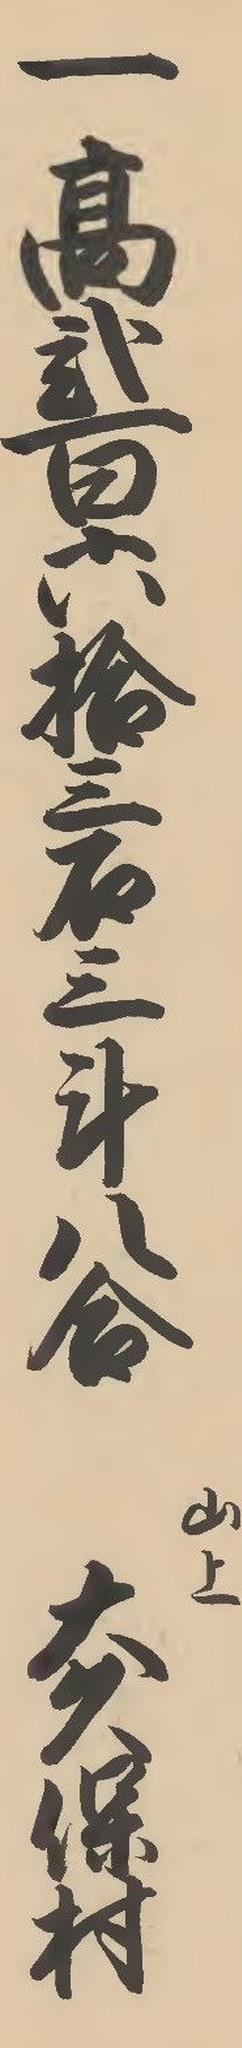一髙弐百六拾三石三斗八合大久保村
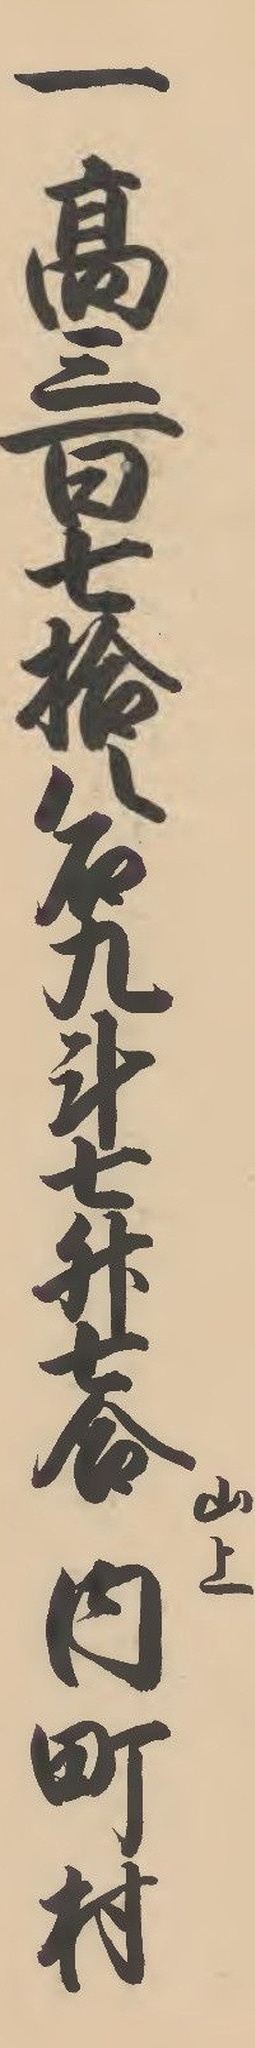一髙三百七拾八石九斗七升七合内町村

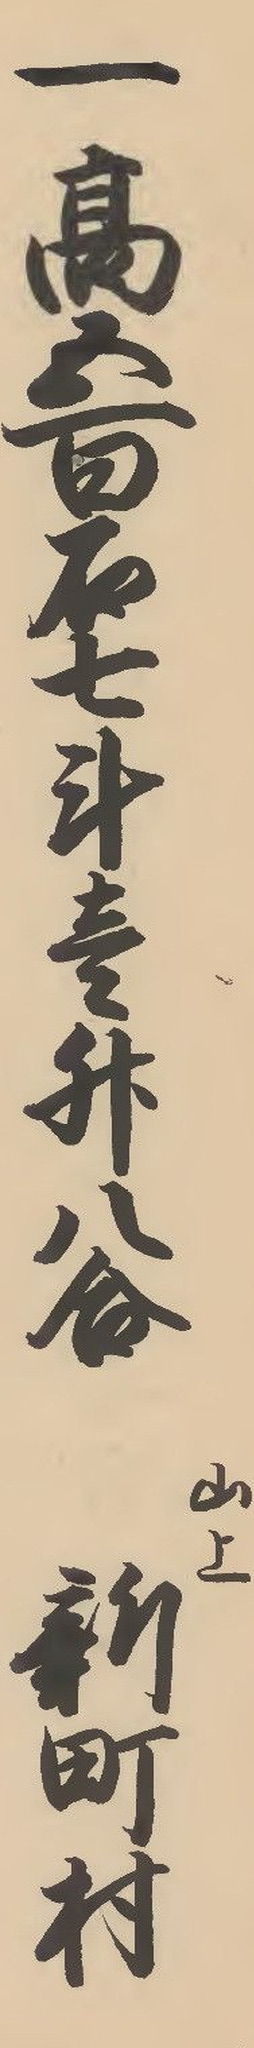一髙五百石七斗壱升八合新町村
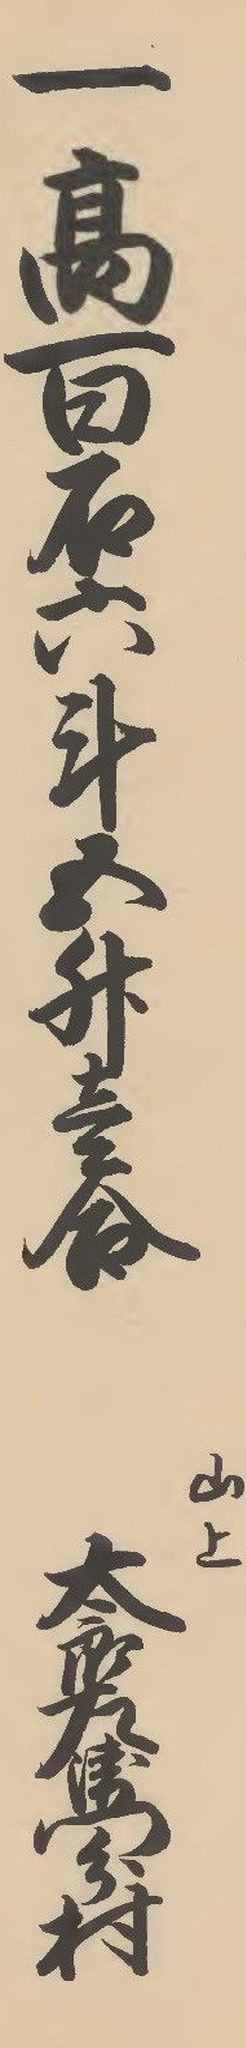一髙百石六斗五升壱合太郎左衛門分村
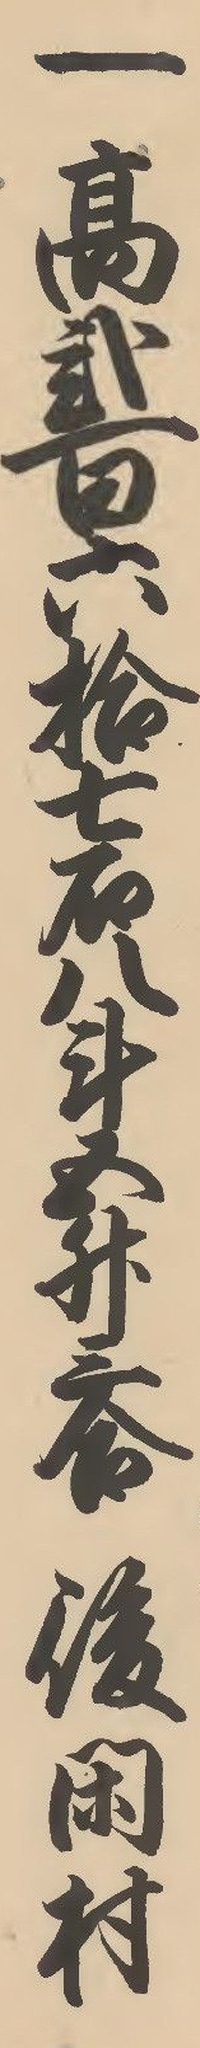一髙弐百六拾七石八斗五升三合後閑村
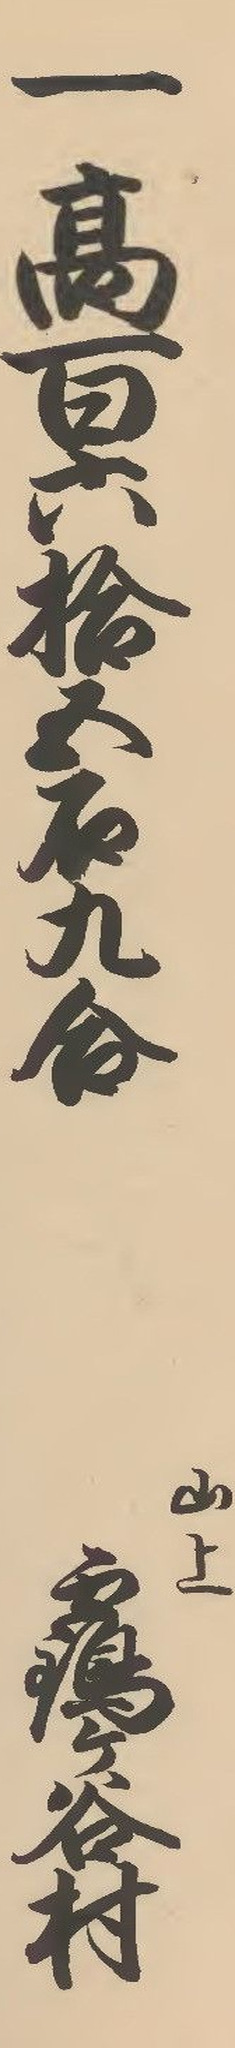一髙百六拾五石九合鶴ケ谷村
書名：上野国郷帳
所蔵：国立公文書館 National Archives of Japan
